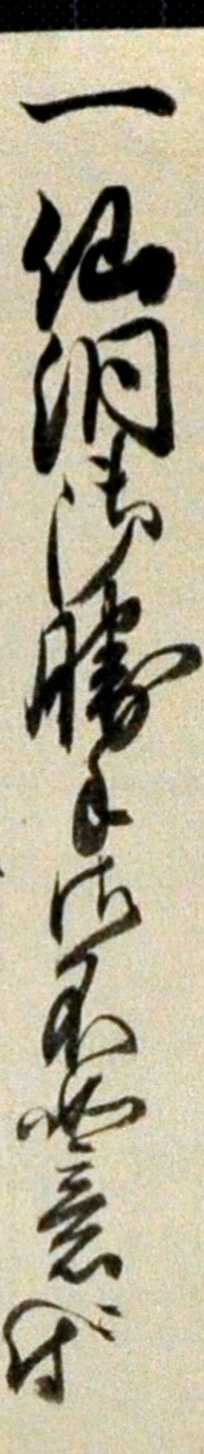一仙洞御勝手御不如意に付
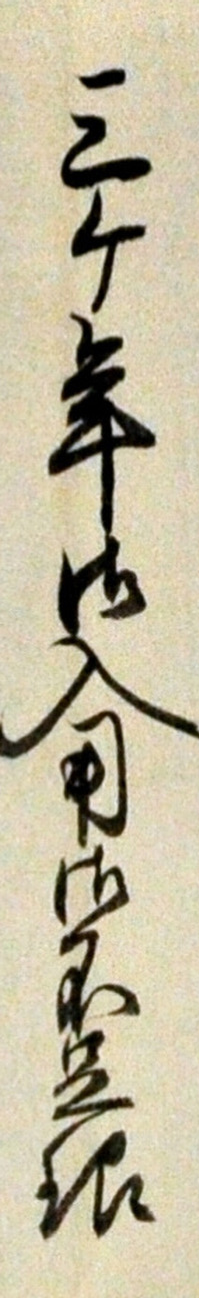三ケ年御入用御不足銀
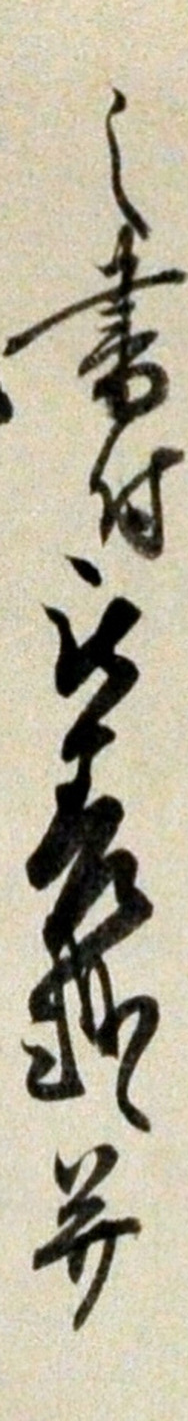之書付被差越候并
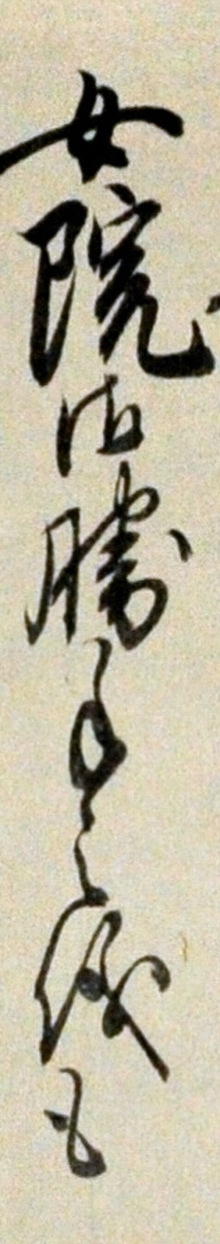女院御勝手之儀も
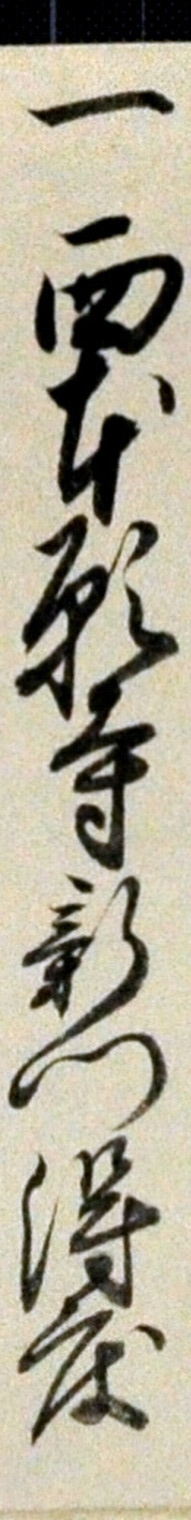一西本願寺新門得度
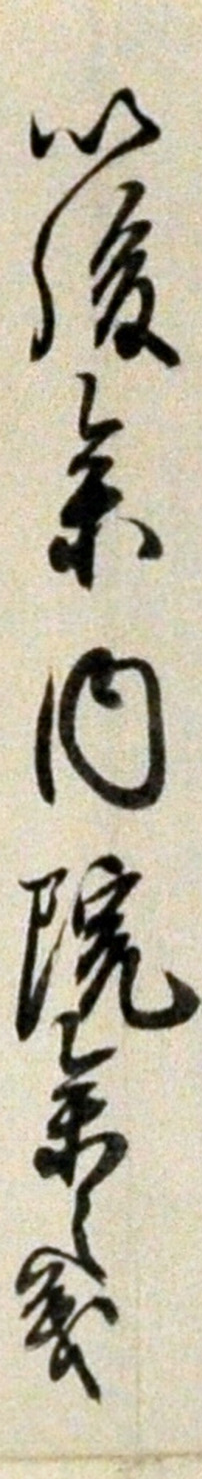以後参内院参之義
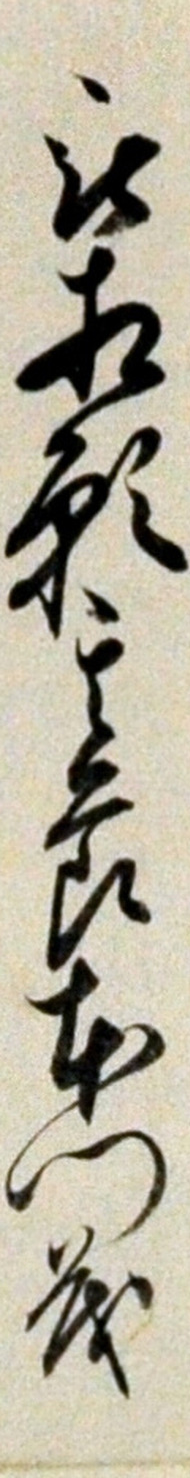被相願其節本門も
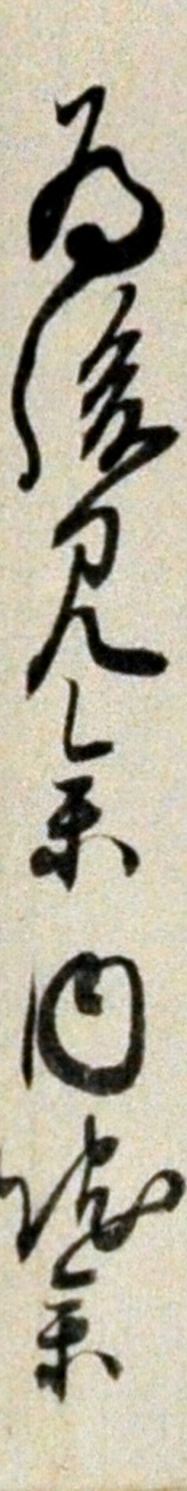為後見参内院参
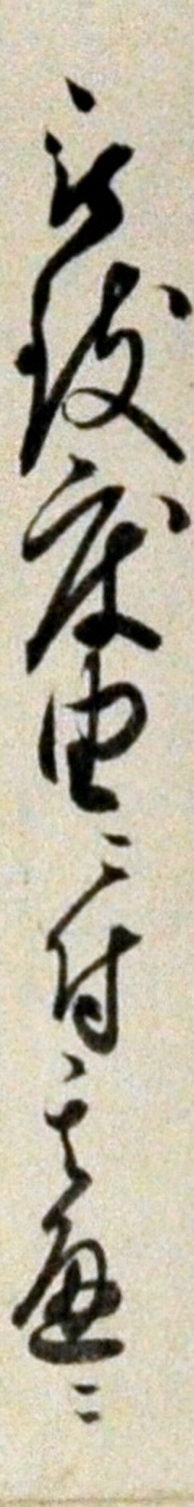被致度由に付其通に
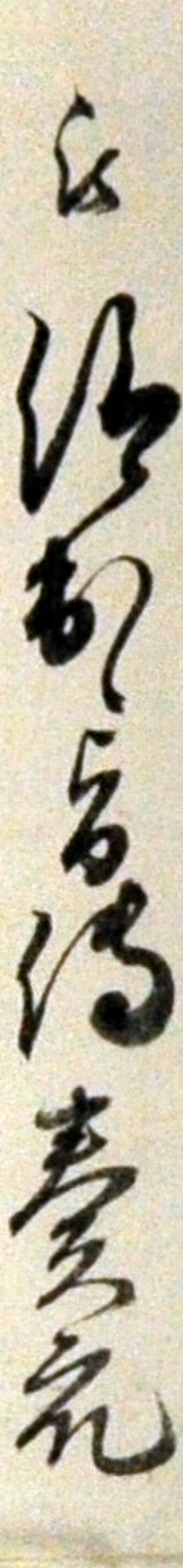被仰出候旨伝奏衆
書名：書状
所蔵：伊那市立高遠町図書館・合同会社AMANE
